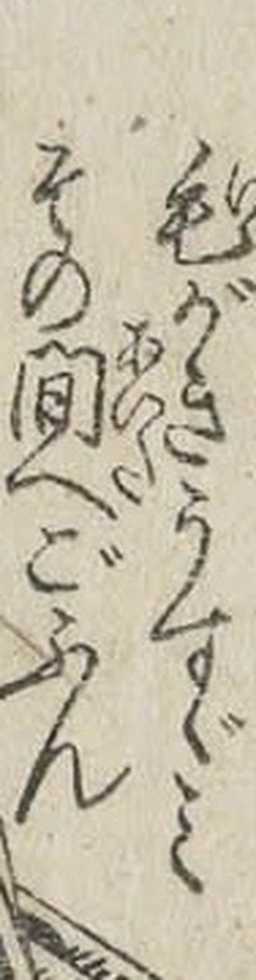その間へごふん
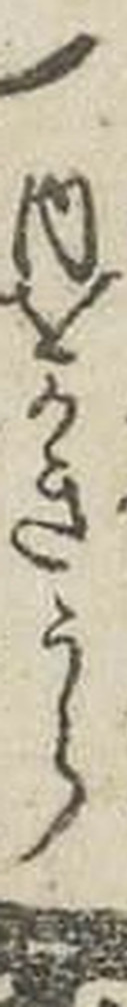内をかきうらしる
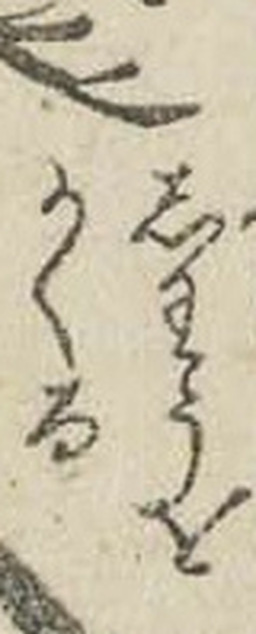かくる
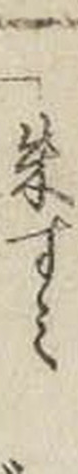朱ずみ
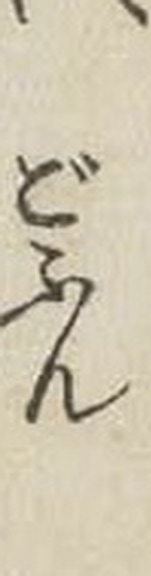ごふん
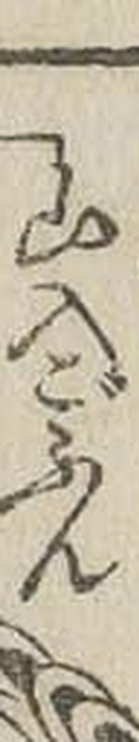山入ごふん
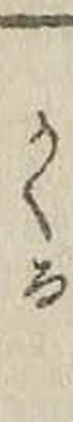かくる
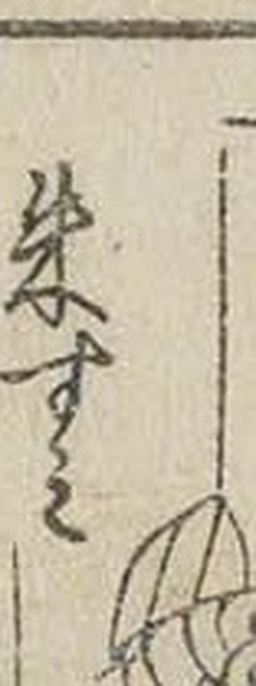朱すみ
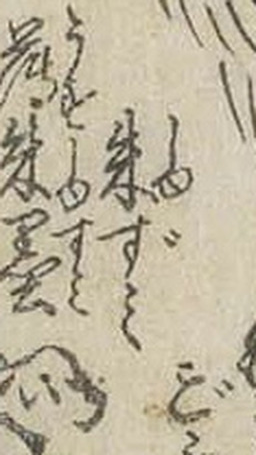朱ずみ
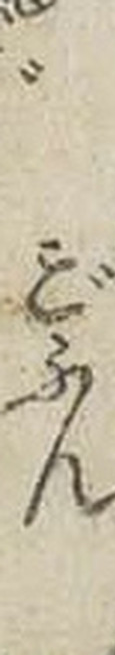ごふん
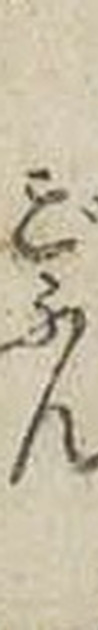ごふん
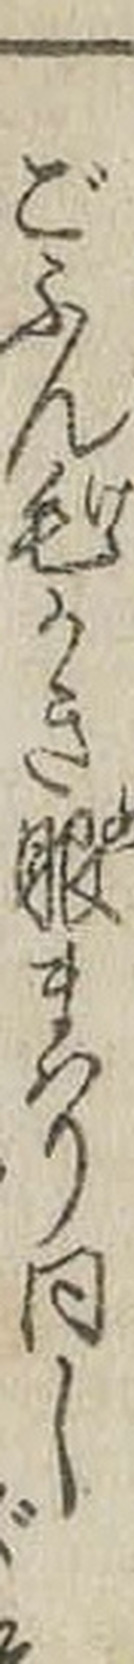ごふん毛かき眼まはり同しくま
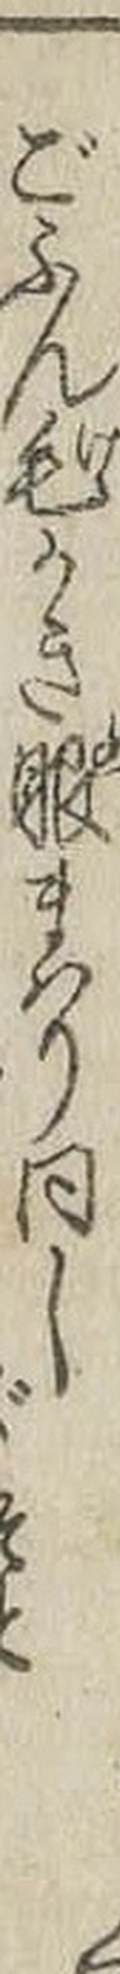ごふん毛かき眼まはり同しくま
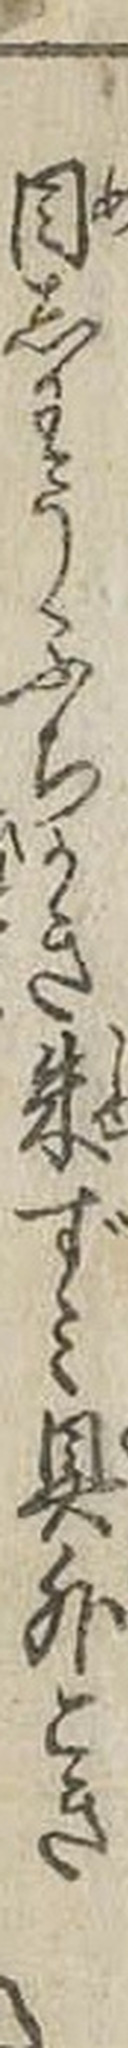目しわうふちかき朱ずみ具外こき
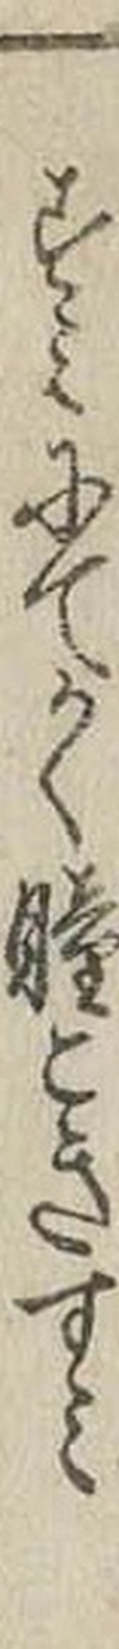すみにてかく瞳こきすみ
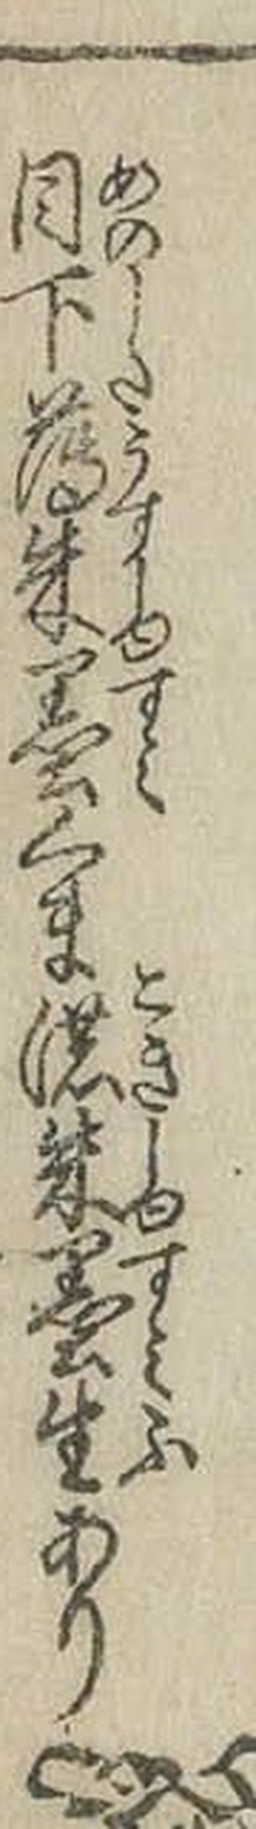目下薄朱墨くま濃朱墨生あり
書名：絵本写宝袋 9巻 8之巻
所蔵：東京学芸大学教育コンテンツアーカイブ
